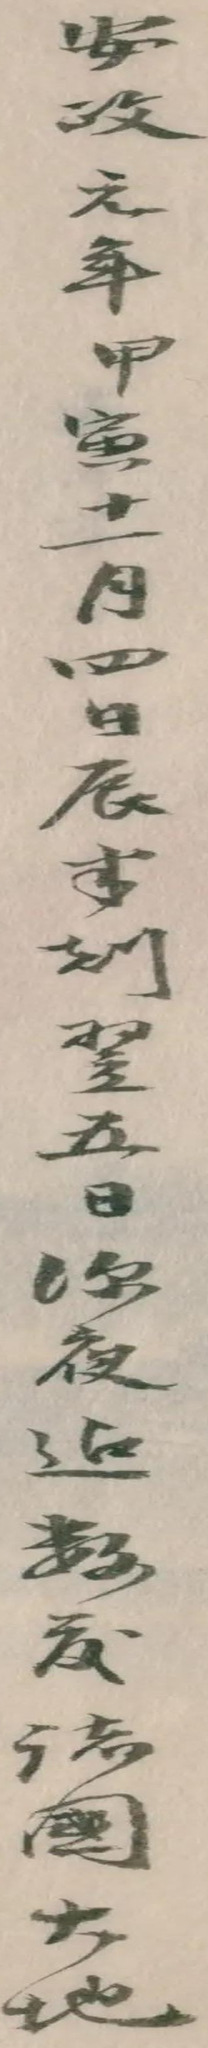安政元年甲寅十一月四日辰半刻翌五日深夜迄数度諸国大地

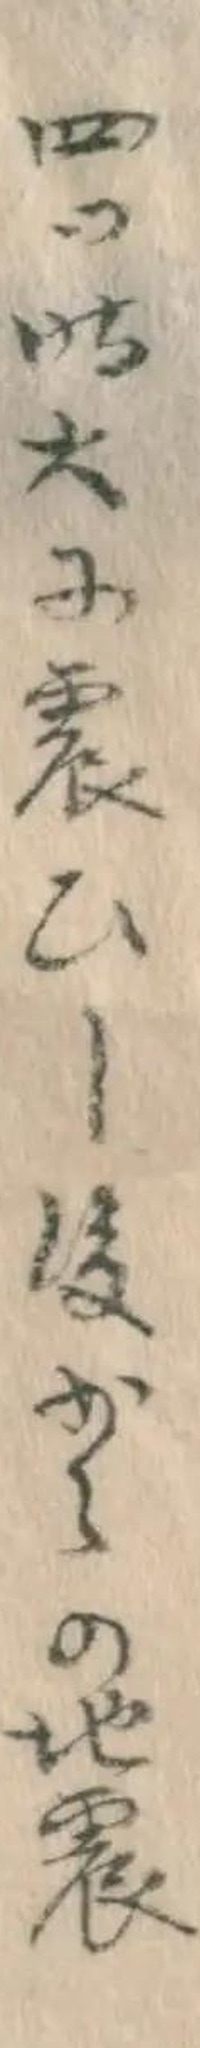四ツ時大に震ひし後少々の地震
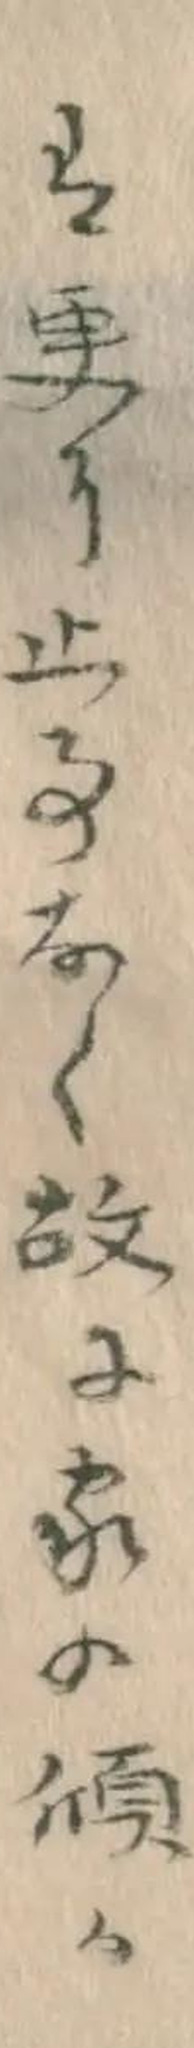有更に止事なく故に家の傾か
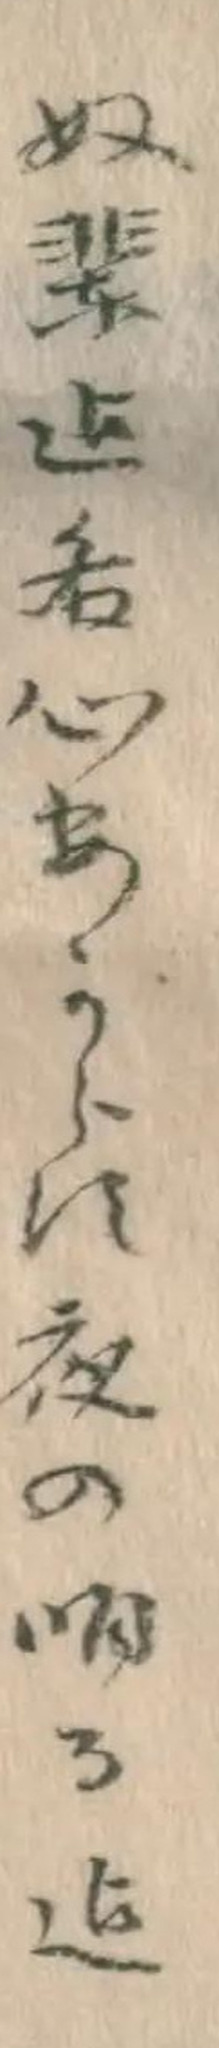ぬ輩迄各心あからす夜の明る迄
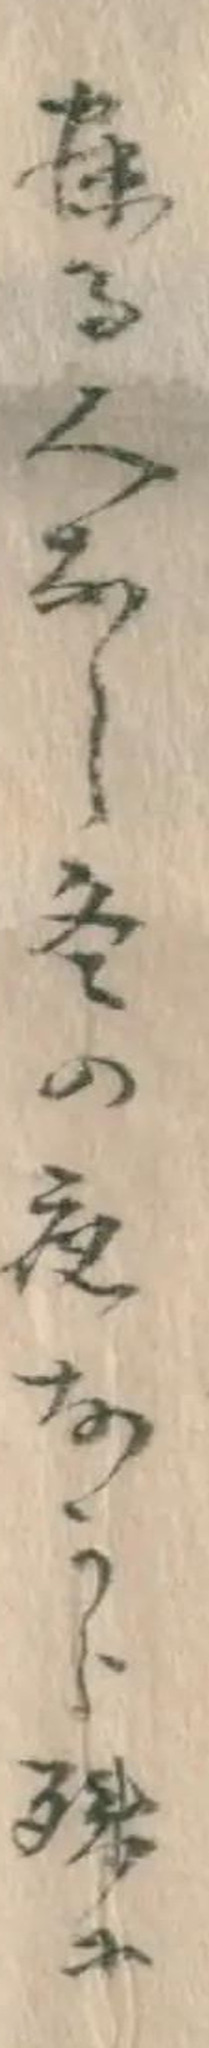寝る人なし冬の夜なから殊に
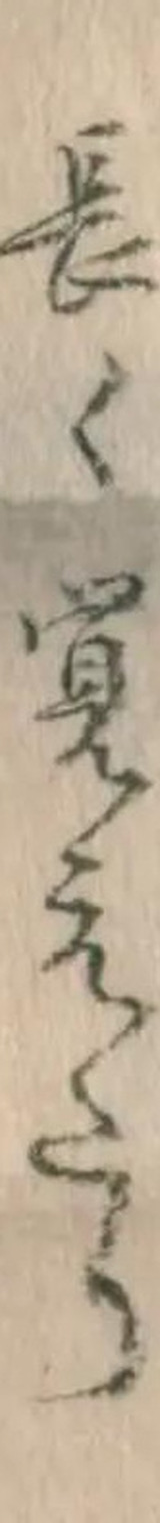長く覚えたり

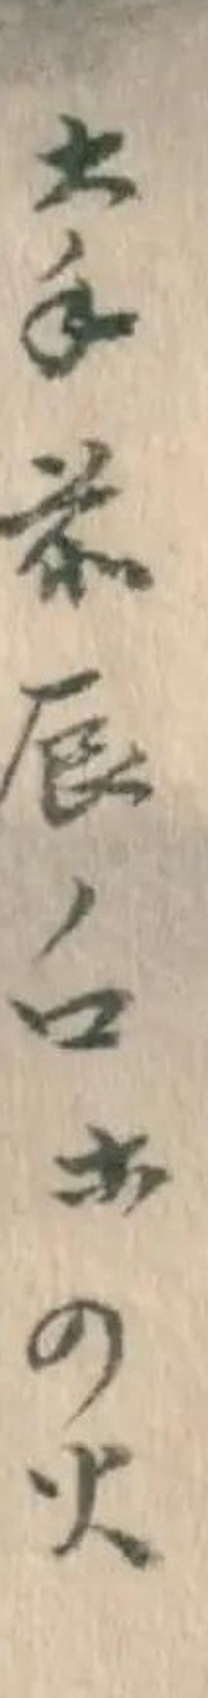大手前辰ノ口等の火
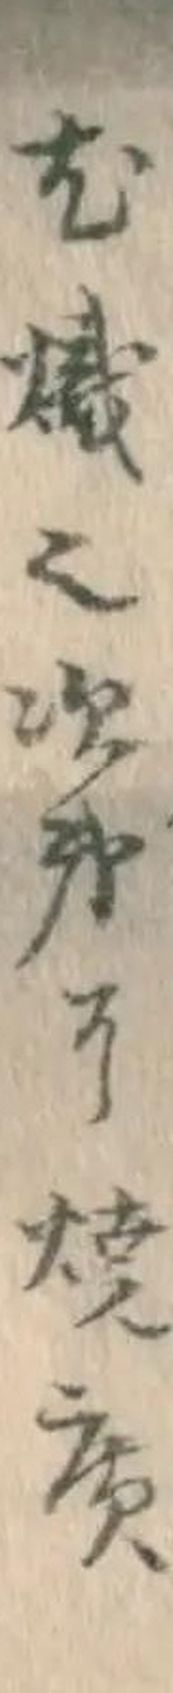尤熾也次第に焼広
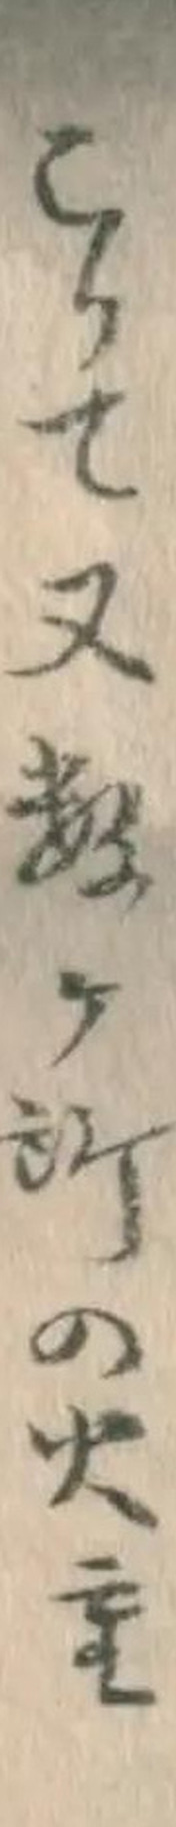こりて又数ヶ所の火重
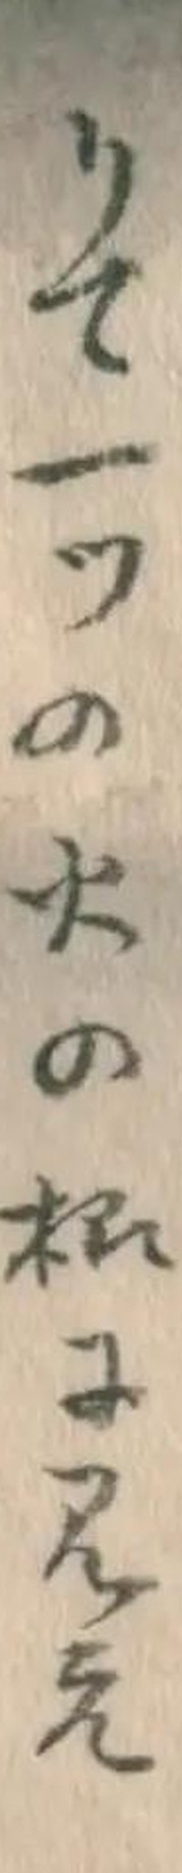りて一ツの火の根に見え

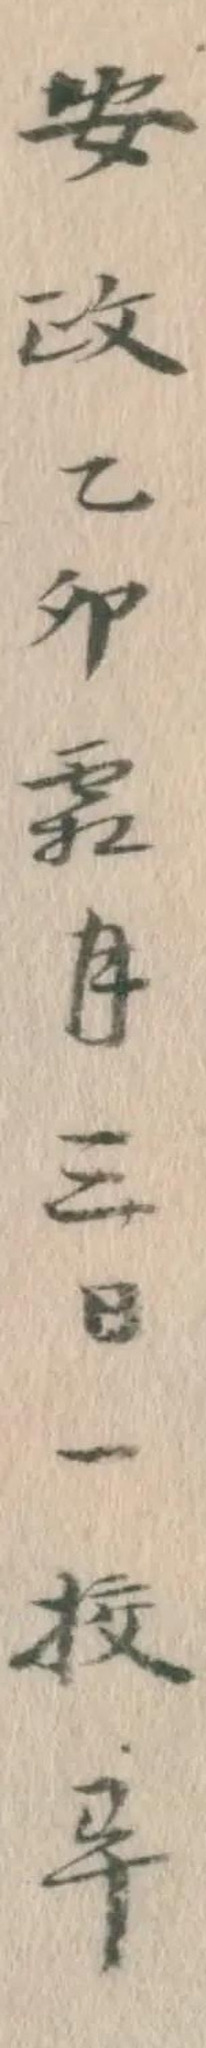安政乙卯霜月三月一校畢
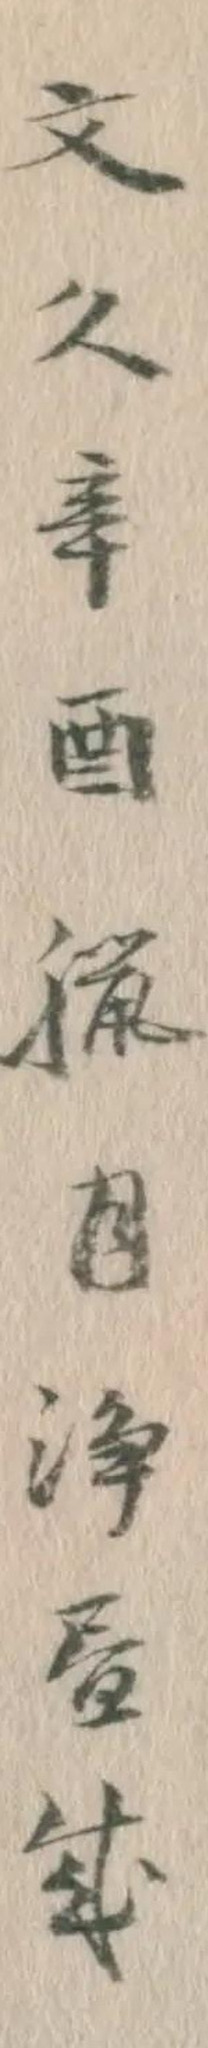文久辛酉猟月浄昼成
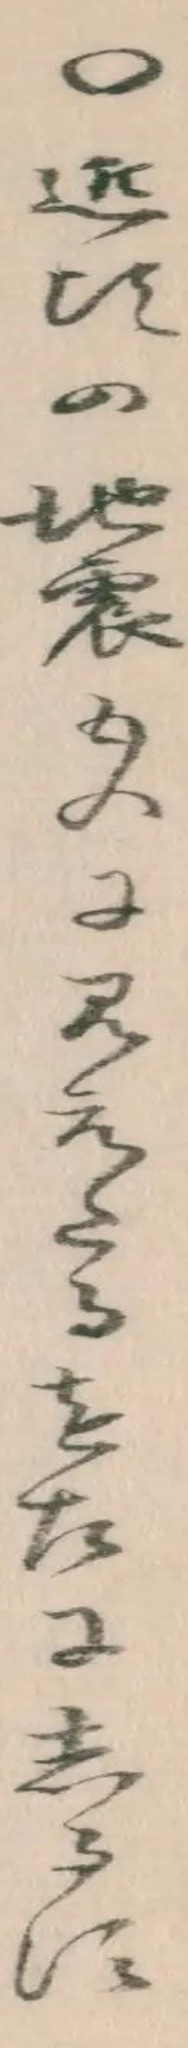○近頃の地震ものに見えたるを左にしるす
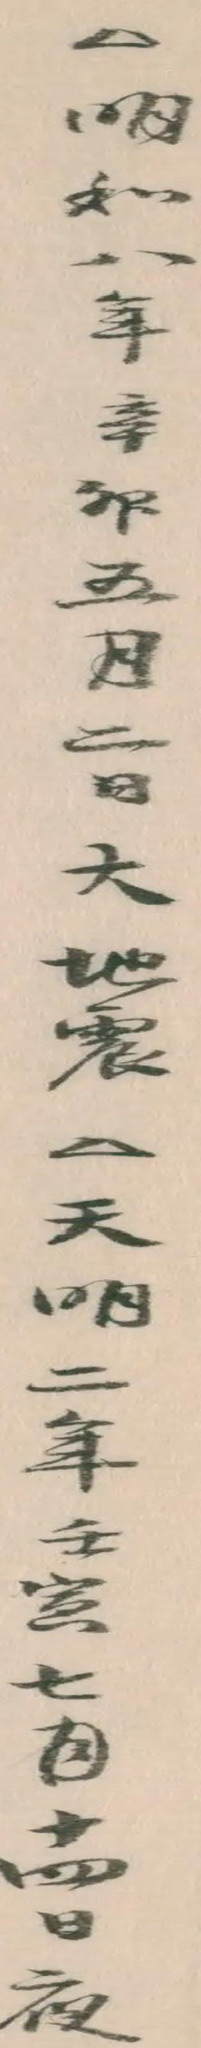△明和八年辛卯五月二日大地震△天明二年壬寅七月十四日夜
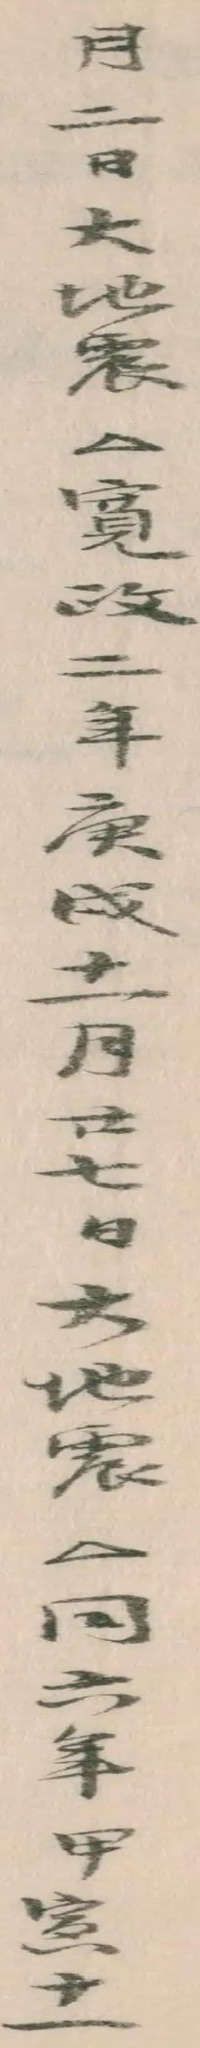月二日大地震△寛政二年庚戌十一月廿七日大地震△同六年甲寅十一
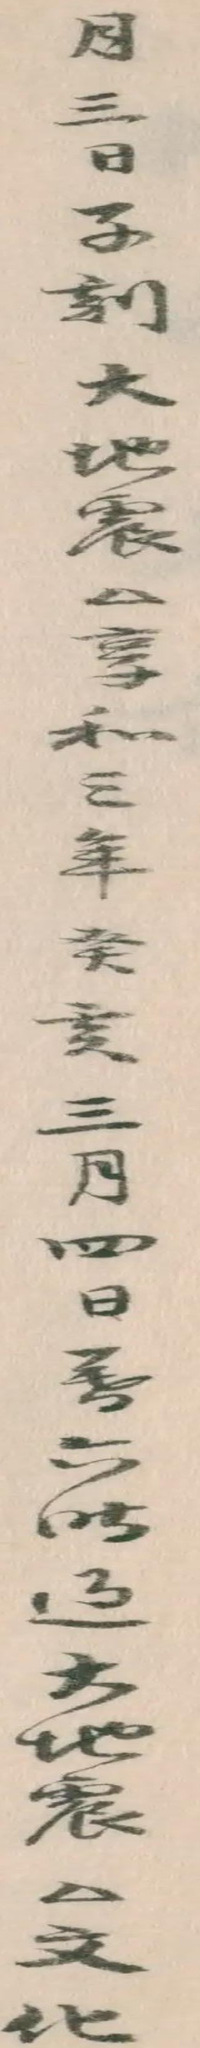月三日子刻大地震△享和三年癸亥三月四日暮六時過大地震△文化
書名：地災撮要. 巻10(地震之部) 上,下
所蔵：国立国会図書館 National Diet Library, JAPAN
